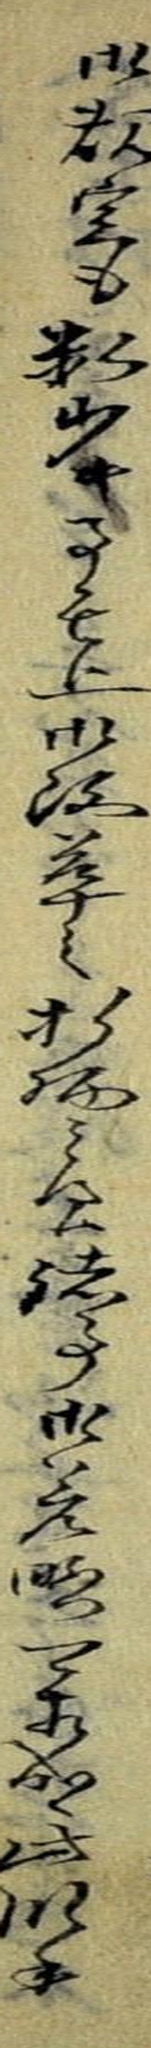御規定も数少キ事其上御改革之折柄に候得は諸事御差略可相成候此段手
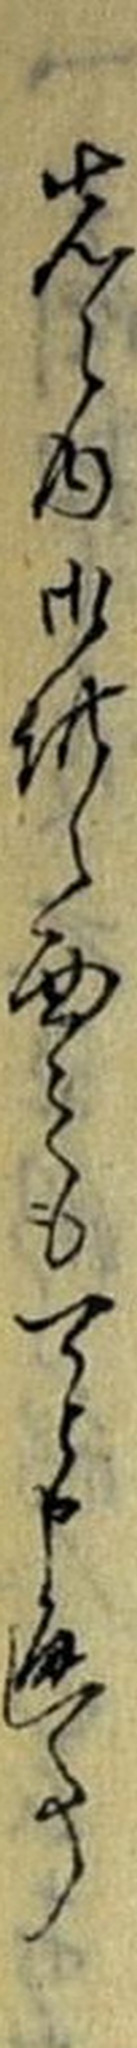先之内御供之面々へも可被申通事
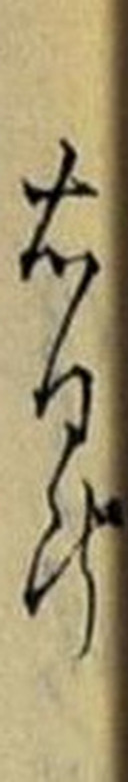右同断
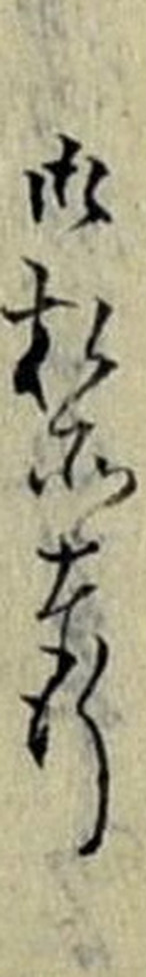御札所奉行
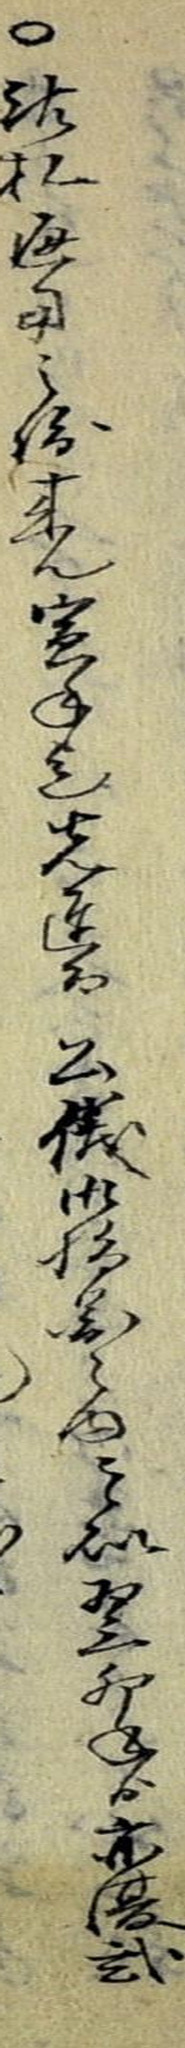○銀札通用之儀来ル寅年迄先達而公儀御指図之内に候処翌卯年ゟ又復弐
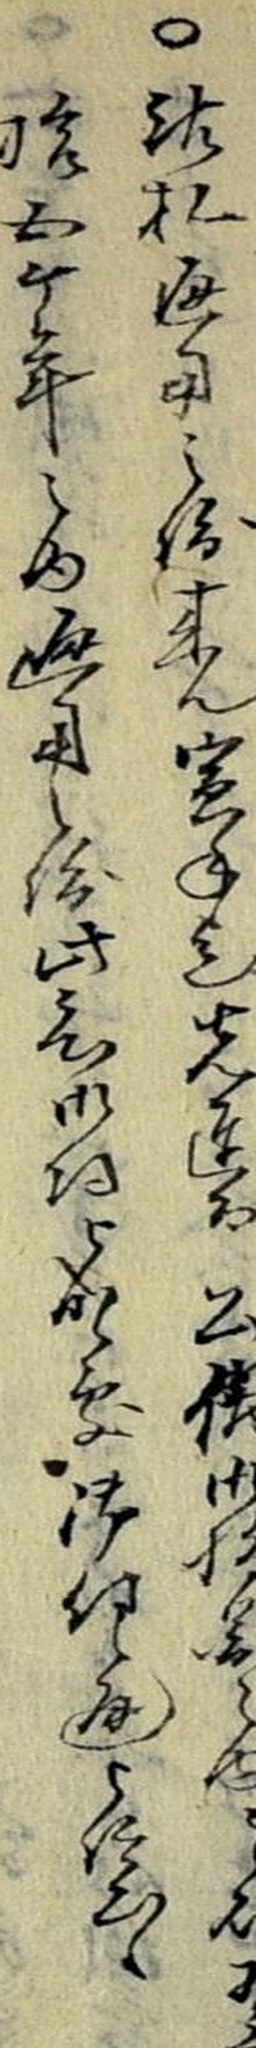拾五ヶ年之内通用之儀此度御伺被成候処御伺之通被仰出候
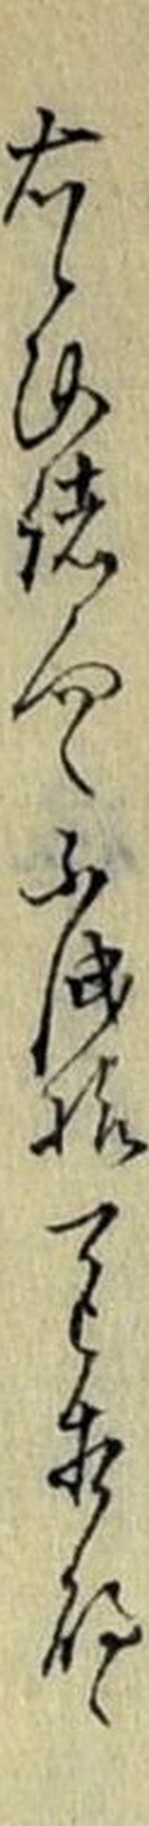右之趣諸向へ不洩様可被相触候
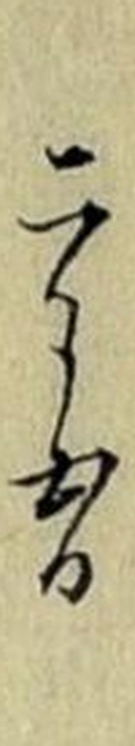二月廿日
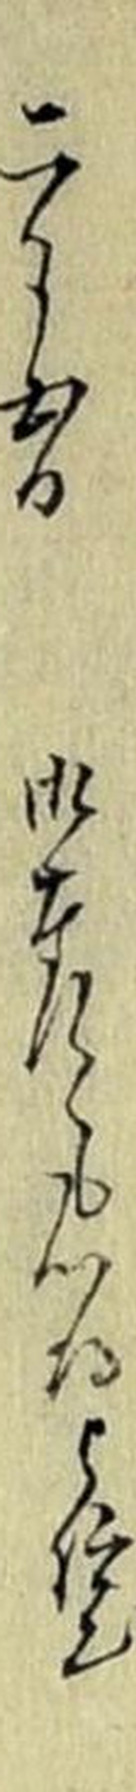二月五日御奉行へも心得被仰出
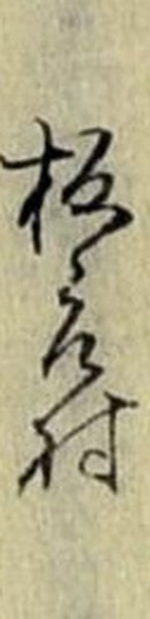板取村
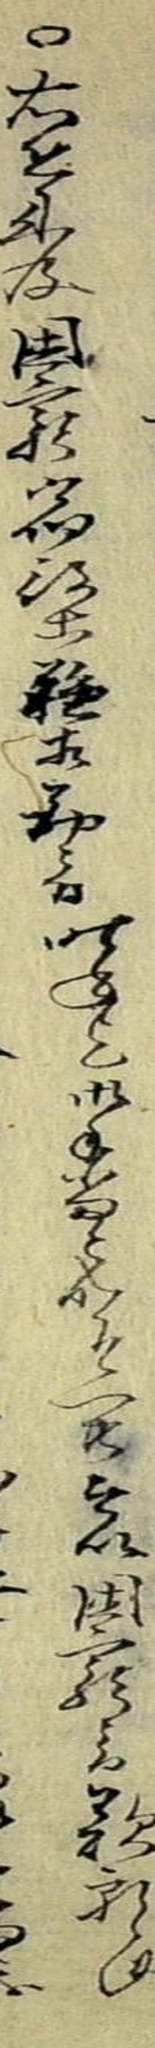○右近来及困窮宿役等難相勤に付昨年迄御手当被成下候へ共今以困窮に而歎願之趣
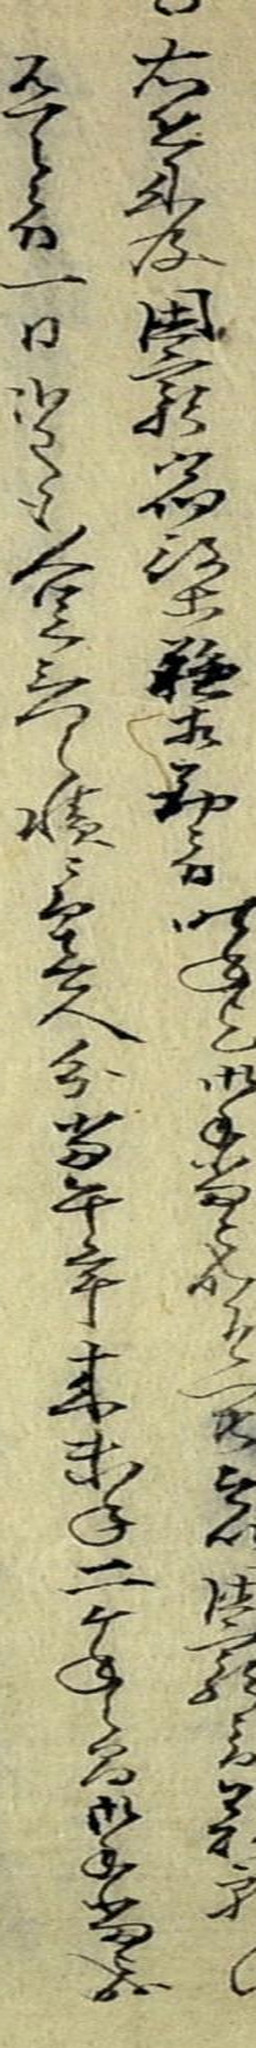有之候に付一日弐匁つヽ人足三人之積に而壱人分当午年来未年二ヶ年之間御手当被成
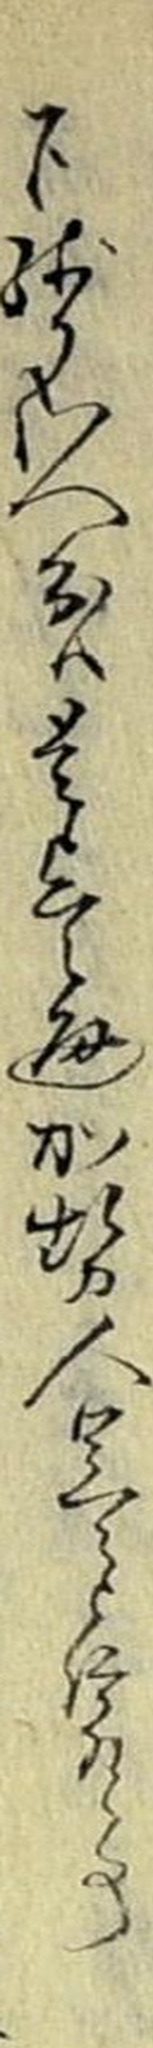下残り弐人分は是迄之通加勢人足に被仰ゟ付候事
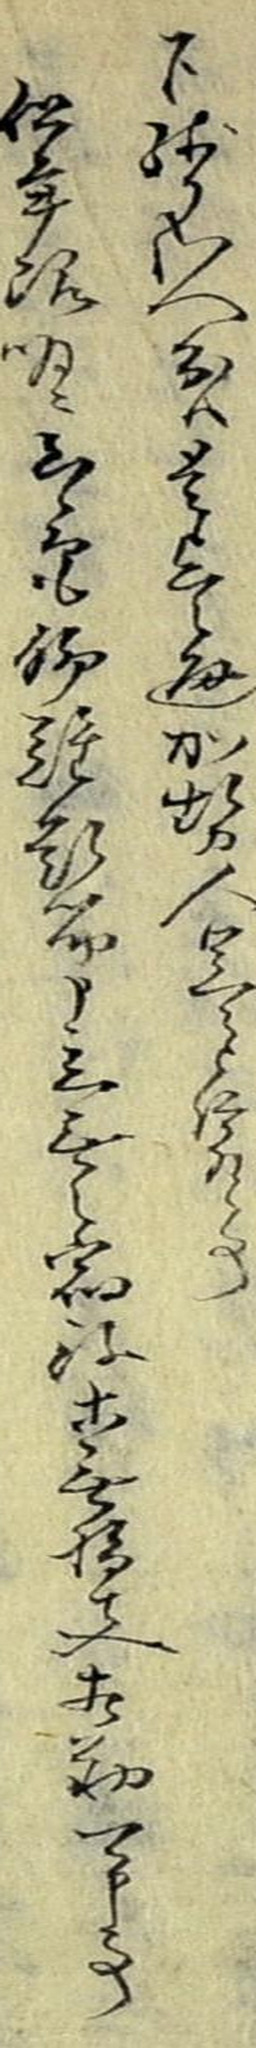但年限明に至候而も聊難題筋申立無之宿役等無指支相勤可申事
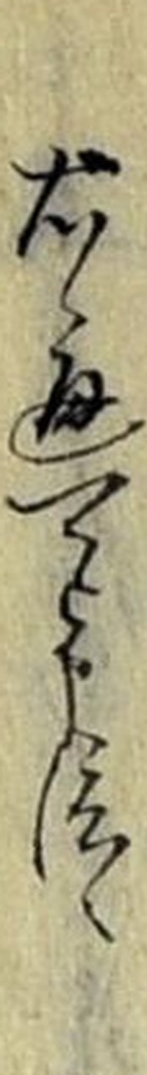右之通可被申渡候
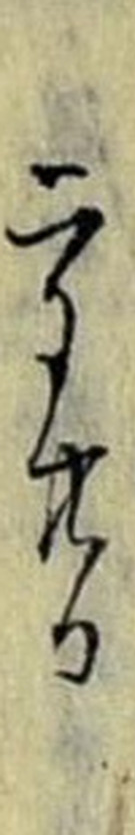二月廿日
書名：命令之部 六
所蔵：福井県文書館 Fukui Prefectural Archives
